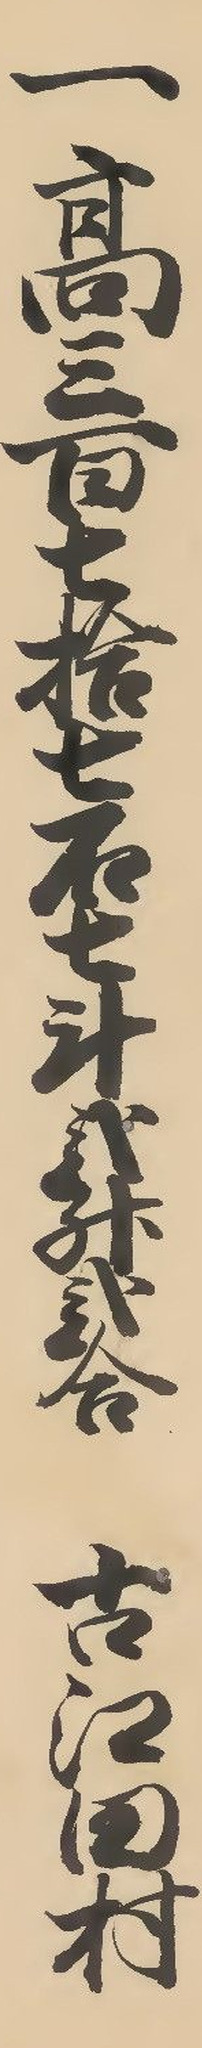一髙三百七拾七石七斗弐升弐合古江田村
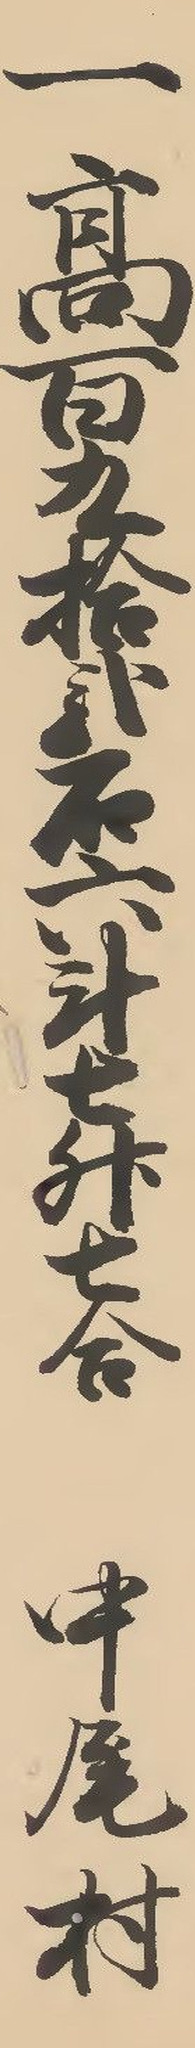一髙百九拾弐石六斗七升七合中尾村
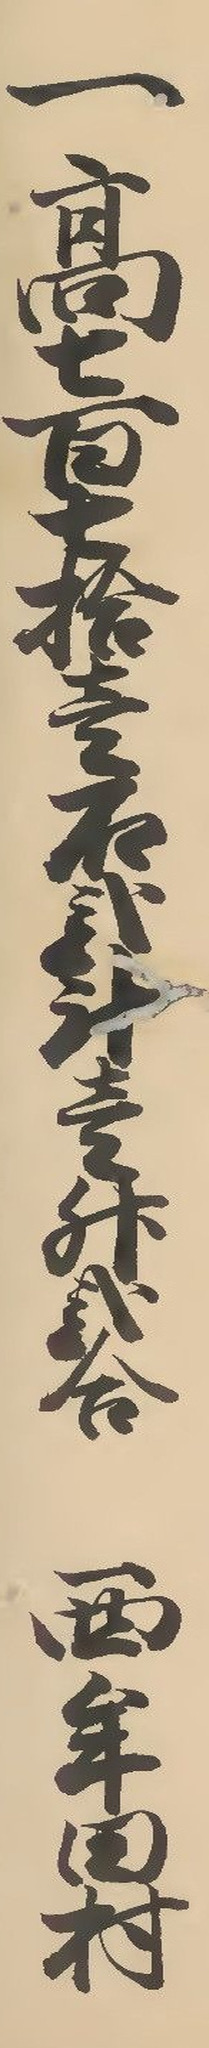一髙七百七拾壱石弐斗壱升弐合西牟田村
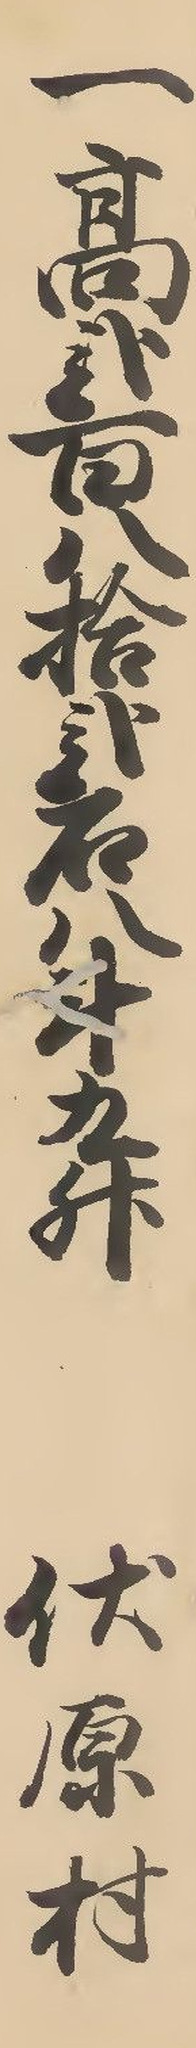一髙弐百八拾弐石八斗九升伏原村
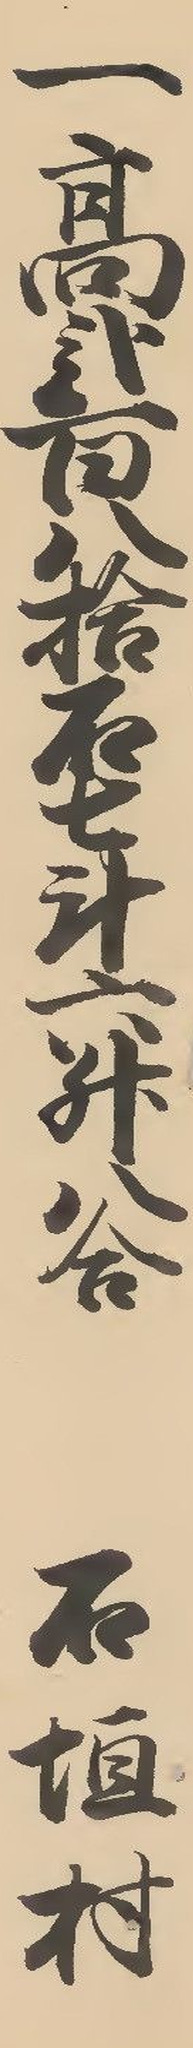一髙弐百八拾石七斗六升八合石垣村
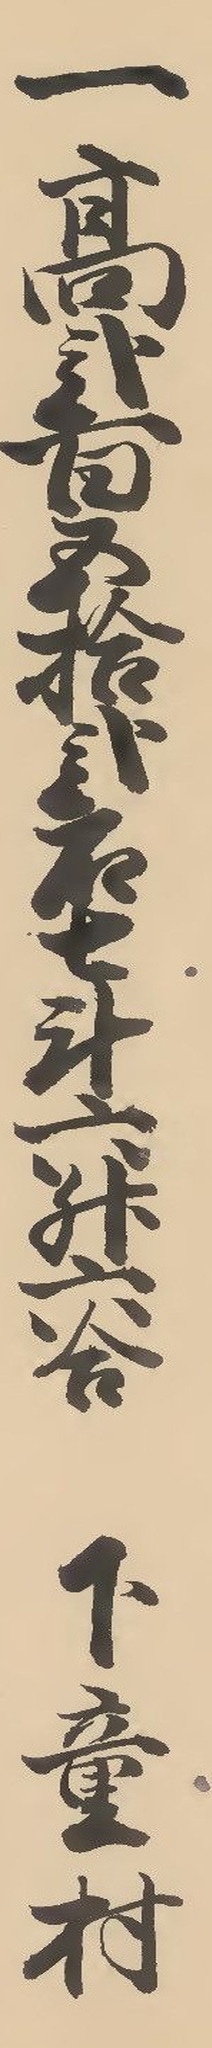一髙弐百五拾弐石七斗六升六合下童村
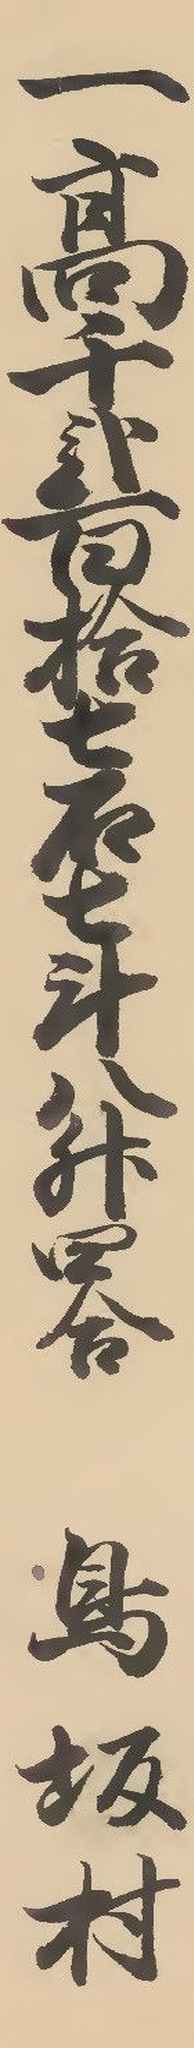一髙千二百拾七石七斗八升四合鳥坂村

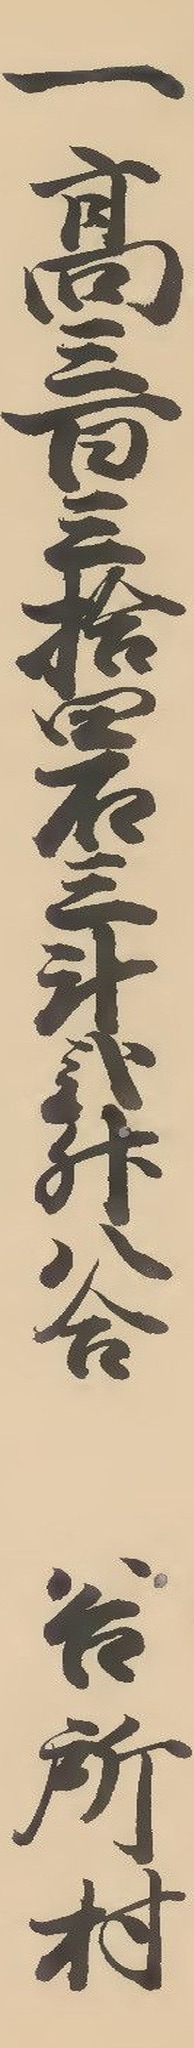一髙三百三拾四石三斗弐升八合谷所村
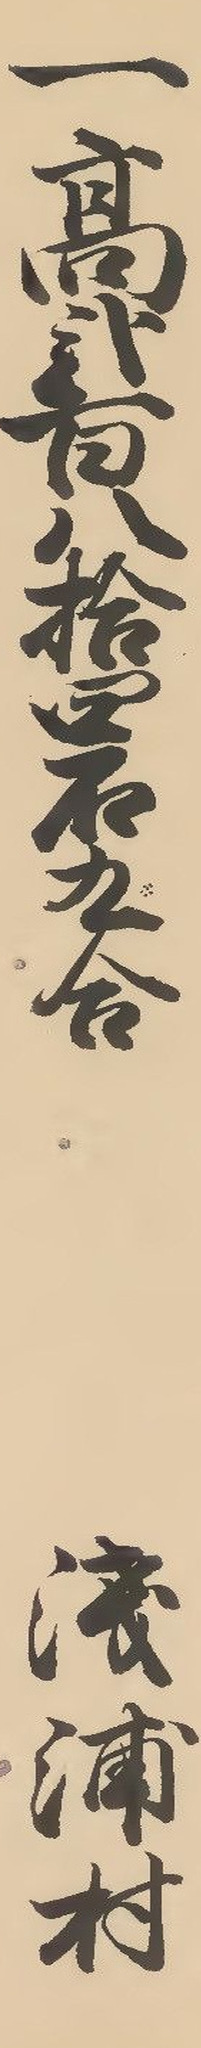一髙弐百八拾四石九合浅浦村
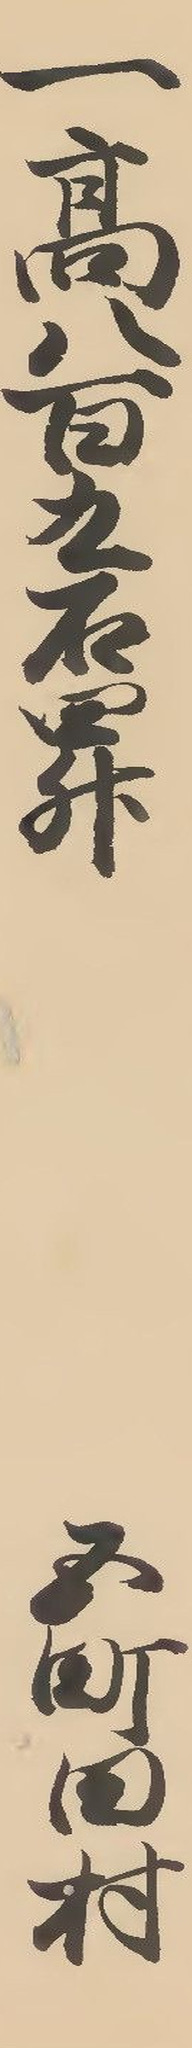一髙八百九石四升五町田村
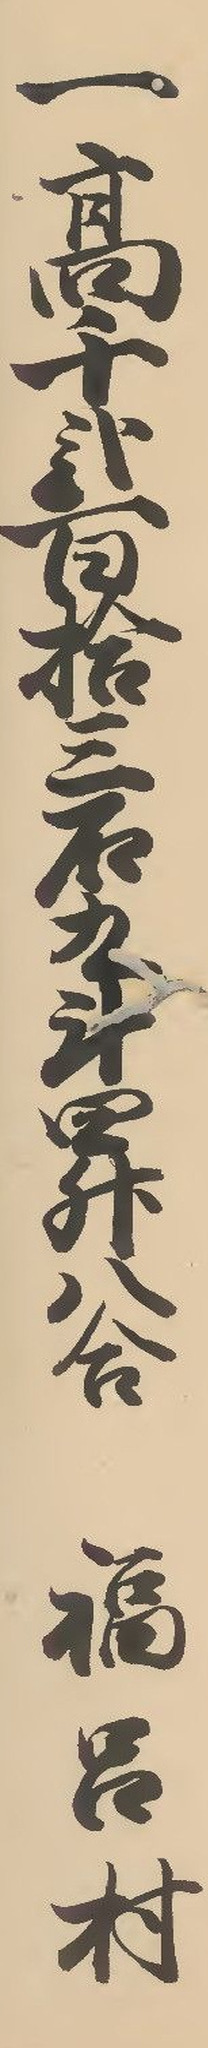一髙千弐百拾三石九斗四升八合福呂村
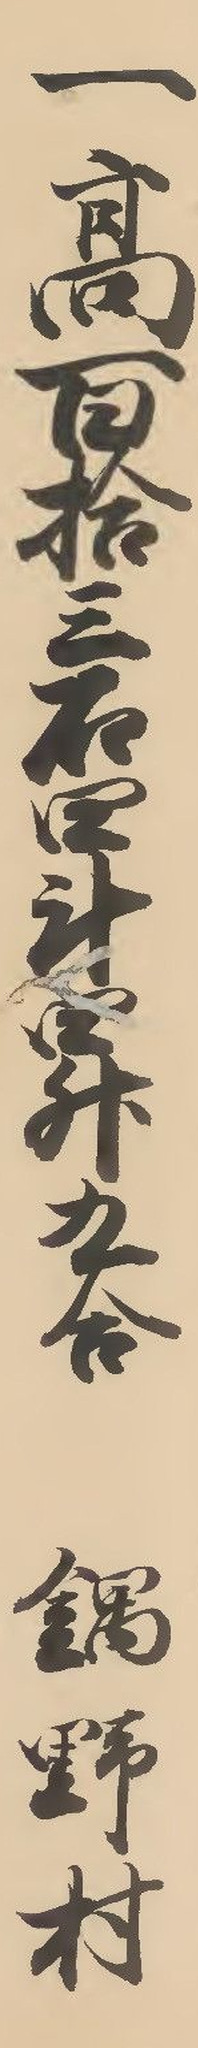一髙百拾三石四斗四升九合鍋野村
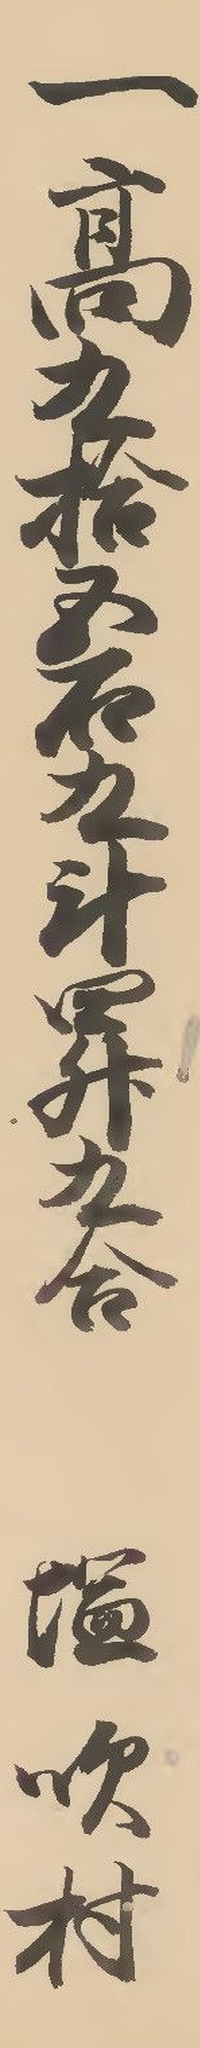一髙九拾五石九斗四升九合塩吹村
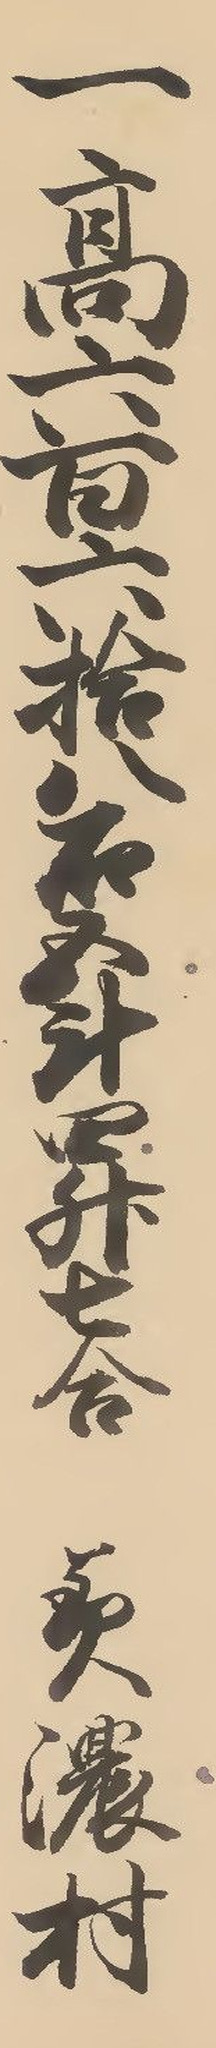一髙六百六拾八石五斗四升七合濃村
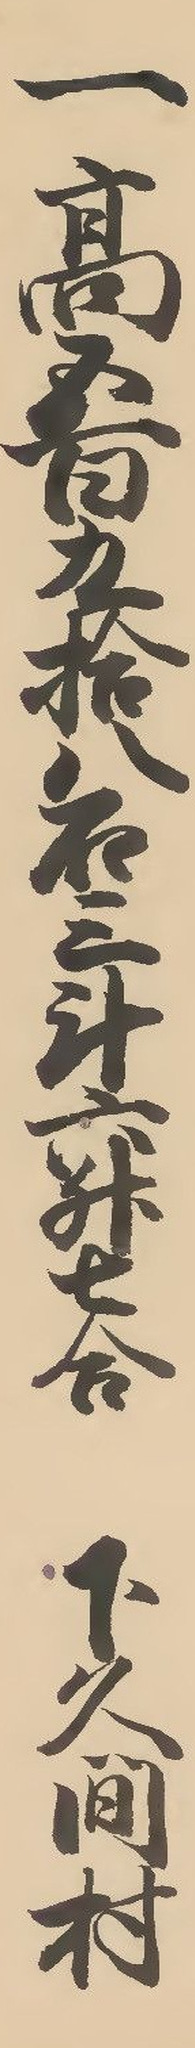一髙五百九拾八石三斗六升七合下久間村

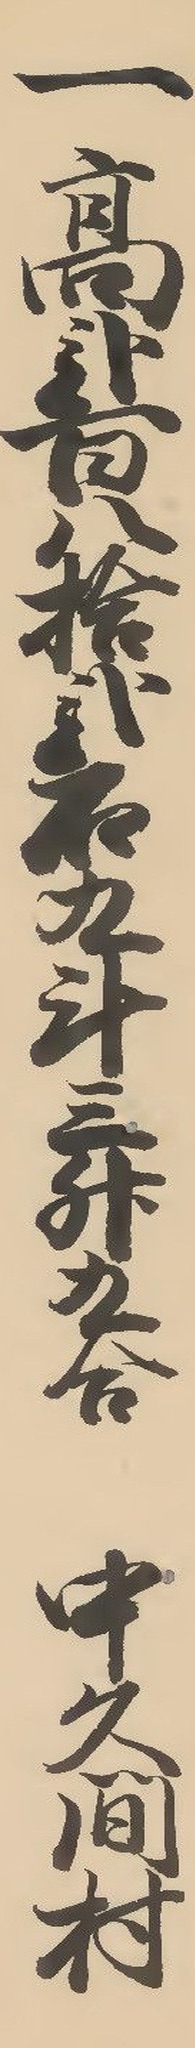一髙弐百八拾弐石九斗三升九合中久間村
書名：肥前国郷帳
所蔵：国立公文書館 National Archives of Japan
